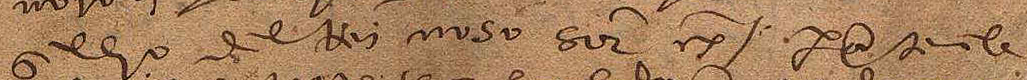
selho del Rej noso sor̄ c̄ꝭ /. ꝑāte ele
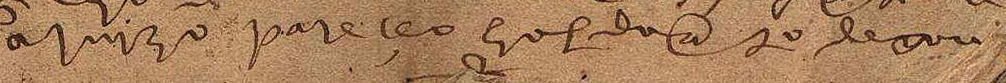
a Juizo pareçeo ho Ldo āto de gou
